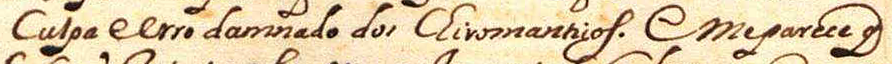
Culpa e erro damnado dos Chiromanticos. E me parece q̄
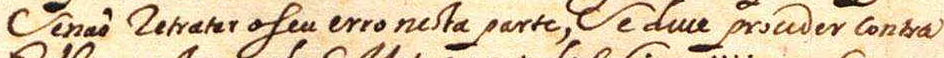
Se naõ Retratar o seu erro nesta parte, Se deue proceder contra
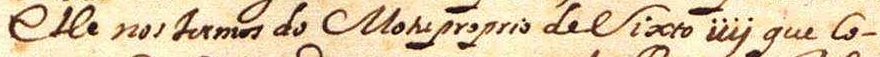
elle nos termos do Motu proprio de Sixto iiij que co
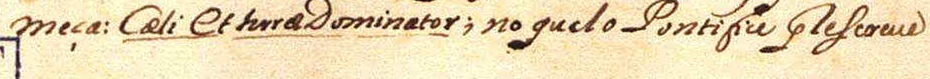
meça: Cœli et terræ Dominator; na qual o Pontifice pRescreue
